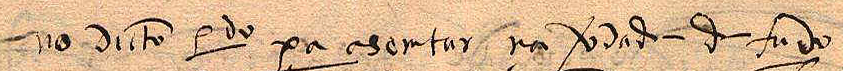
no dīcto Ldo ꝑa asemtar na ꝟdade de tudo
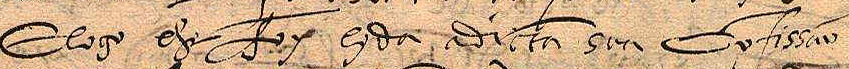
E logo lhe foy lyda a dīcta sua Cōfissão
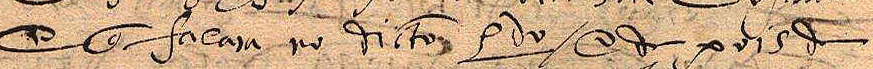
e q̄ falara no dic̄to Ldo / e depois de
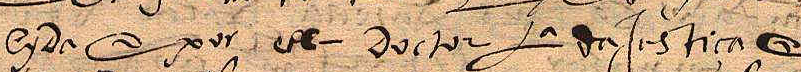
lyda e por elle doctor ta da Justiça ē
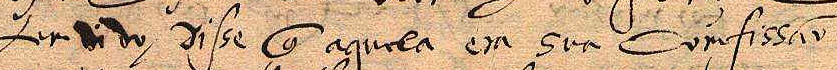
temdido disse q̄ aquela era sua Comfissão
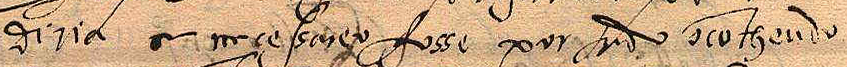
dizia se necessareo fosse por tudo o cōtheudo
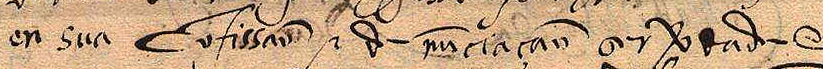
en sua Cōfissão e denūciação ser ꝟdade e
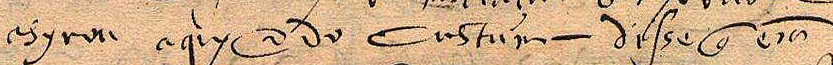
asynou aquy e do Custume disse q̄ ēra
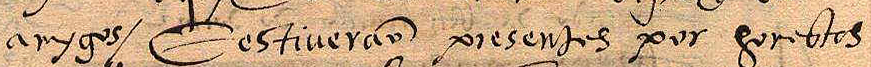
amygos / E estiuerão presentes por honestas
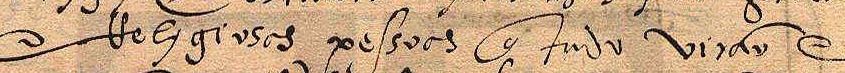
e Relygiosas pessoas q̄ tudo virão e
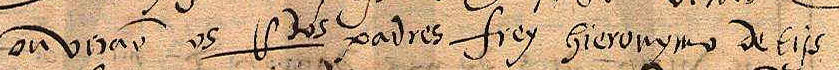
ouvirão os Rdos padres frey hieronymo de lijs
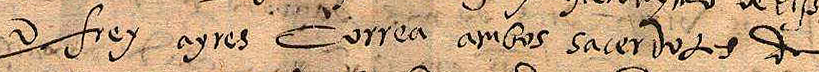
e frey ayres Correa ambos sacerdotes de
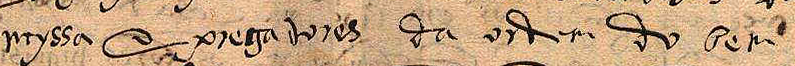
myssa e pregadores da ordem do bem
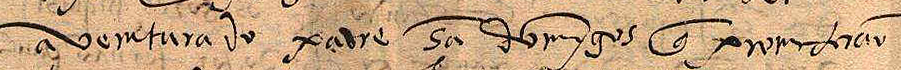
avemturado padre sā dōmygos q̄ prometerão
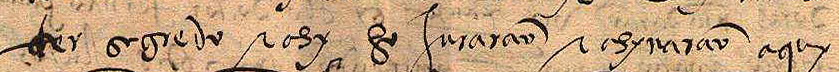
ter segredo e asy ho Jurarão e asynarão aquy
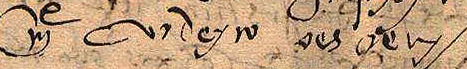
mel Cordeyro o escreuy /
